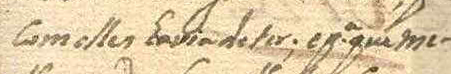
com elles havia de ter; e p.a que me
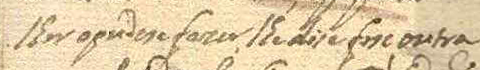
lhor o pudese fazer, lhe dise fose outra
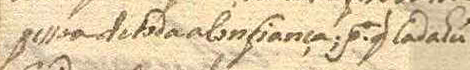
pessoa de toda a Confiança; p.a q̄ Cada hū
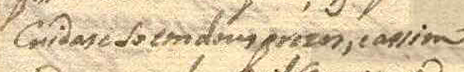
Cuidase so em dous prezos, e assim
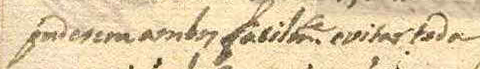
pudesem ambos facilm.te evitar toda
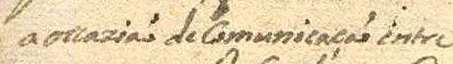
a occaziaõ de comunicaçaõ entre
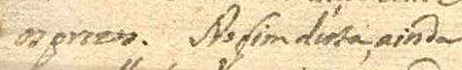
os prezos. No fim desta, ainda
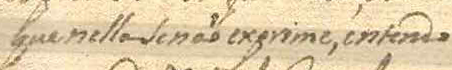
que nella senaõ exprime, entendo
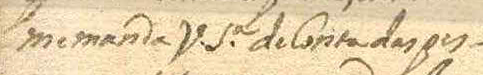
me manda V. S.a de Conta das pes
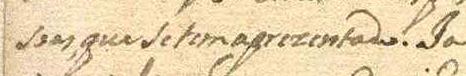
soas, que se tem aprezentado. Ia
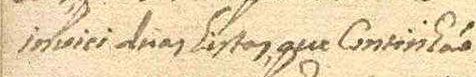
inviei duas Listas, que Continhaõ
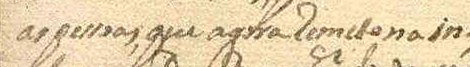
as pessoas, que agora Remeto na in
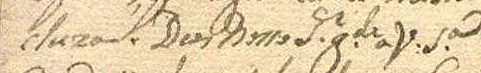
cluza. Deos Nosso S.or g.de a V. S.a
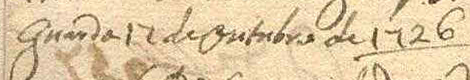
Guarda 17 de Outubro de 1726
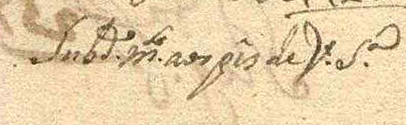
Subd.o m.to aos pês de V. S.a
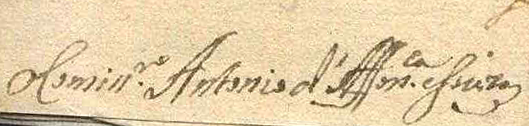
O Comiss.ro Antonio d'Affon.ca e souza
